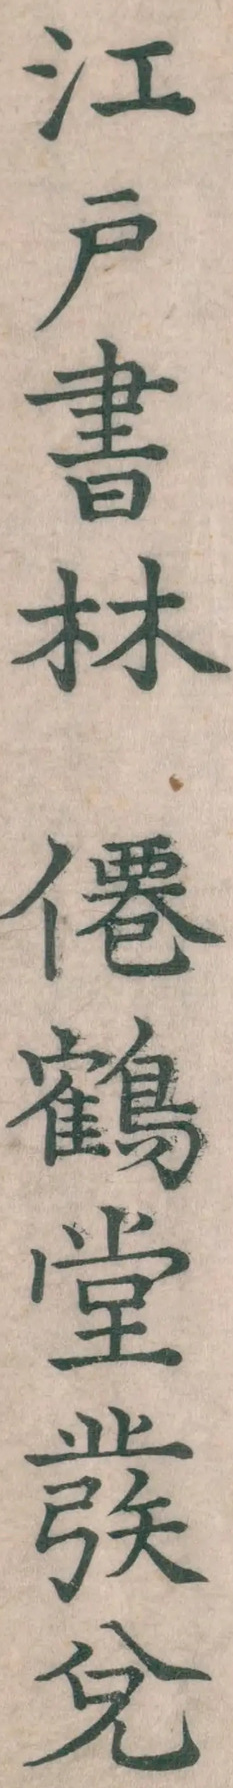江戸書林僊鶴堂發兌

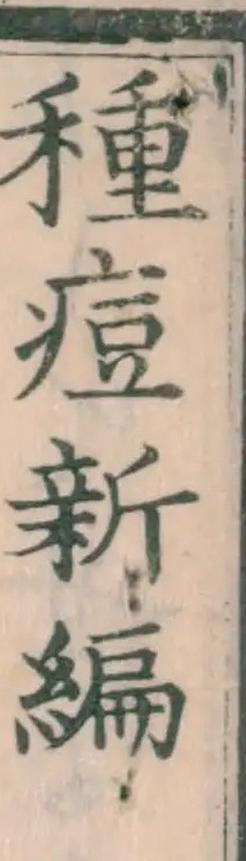種痘新編
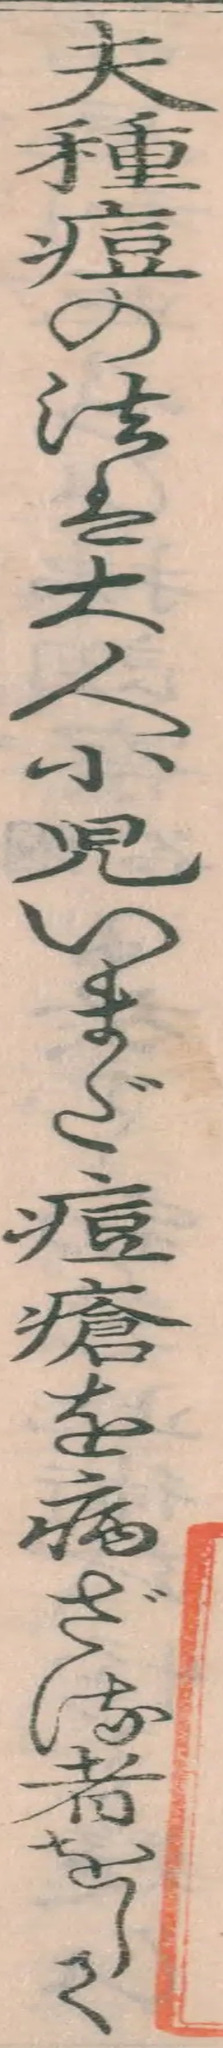夫種痘の法は大人小児いまだ痘瘡を病ざる者をして
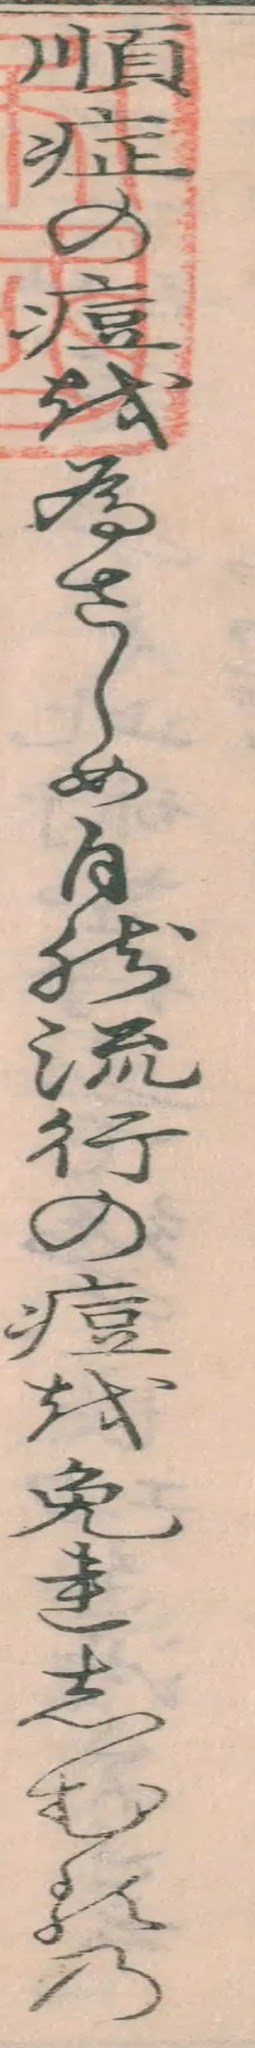順症の痘を為さしめ自然流行の痘を免れしむるの
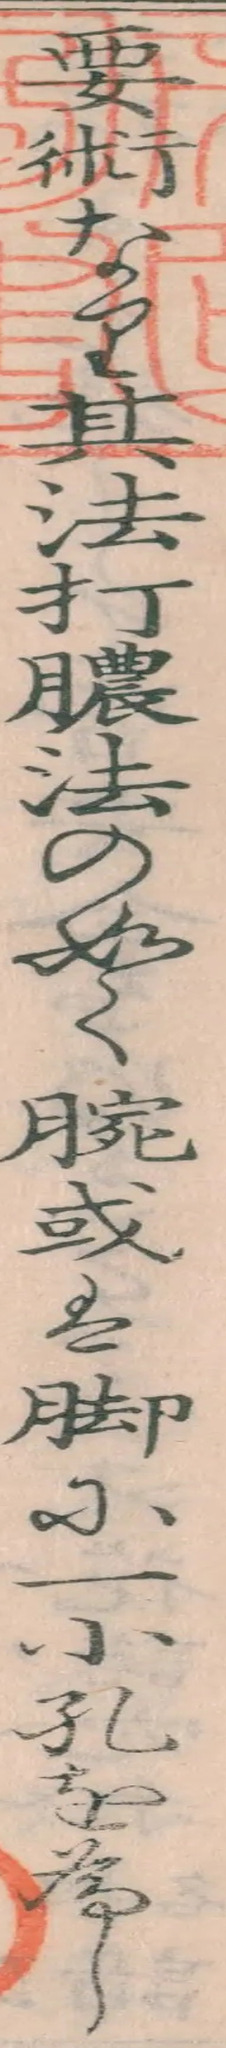要術なり其法打膿法の如く腕或は脚に一小孔を為し
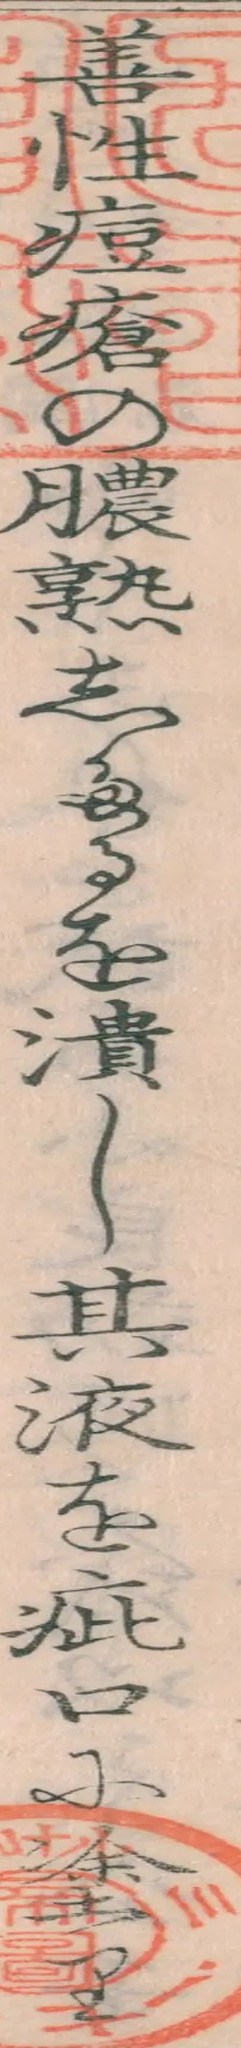善性痘瘡の膿塾したるを潰し其液を疵口に塗り
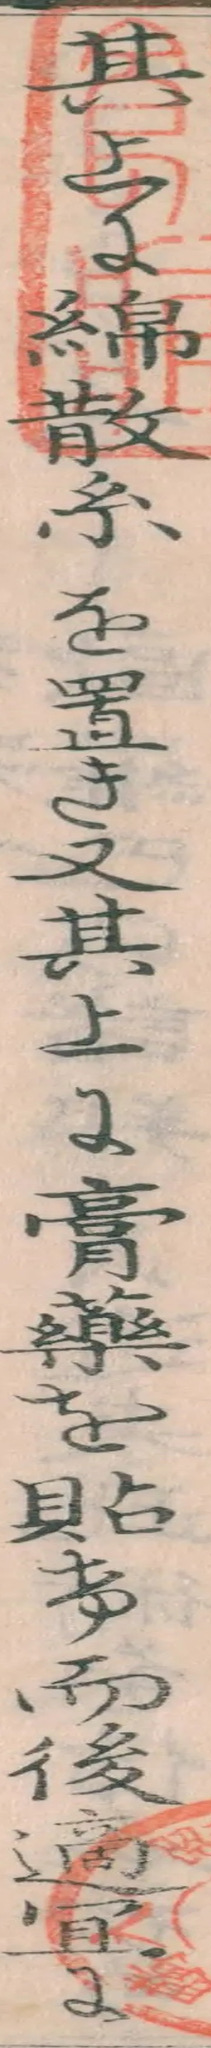其上に綿散糸を置き又其上に膏薬を貼け而後適宜に
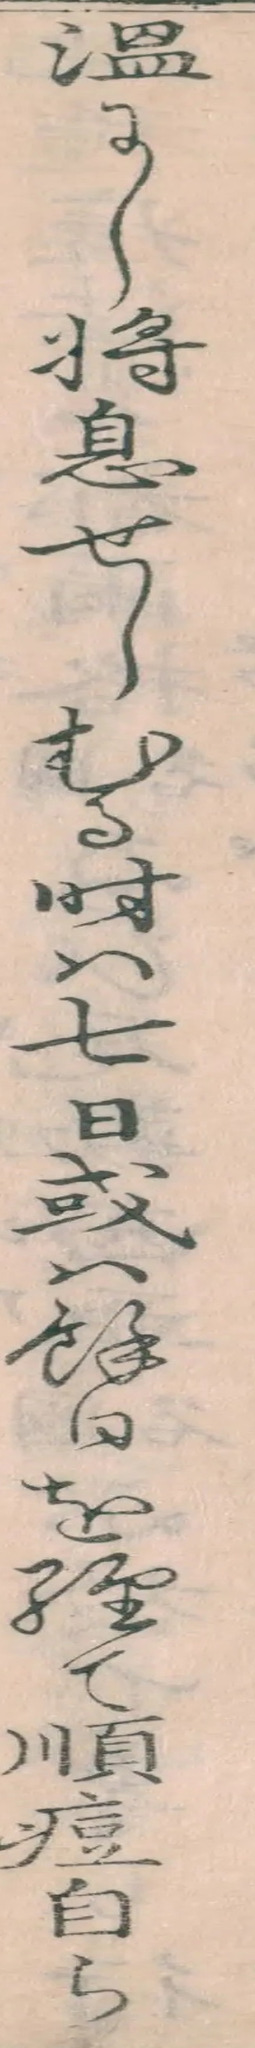温にし将息せしむる時は七日或は餘日を經て順痘自ら
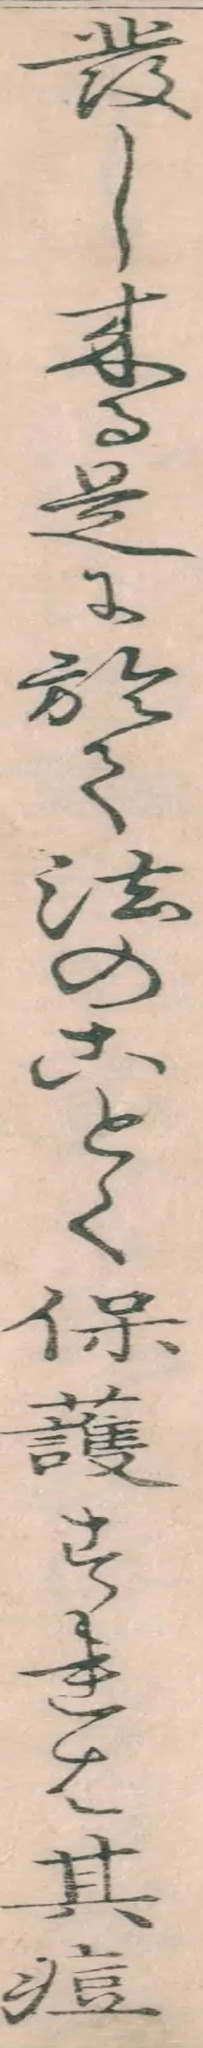發し来る是に於て法のことく保護すれは其痘
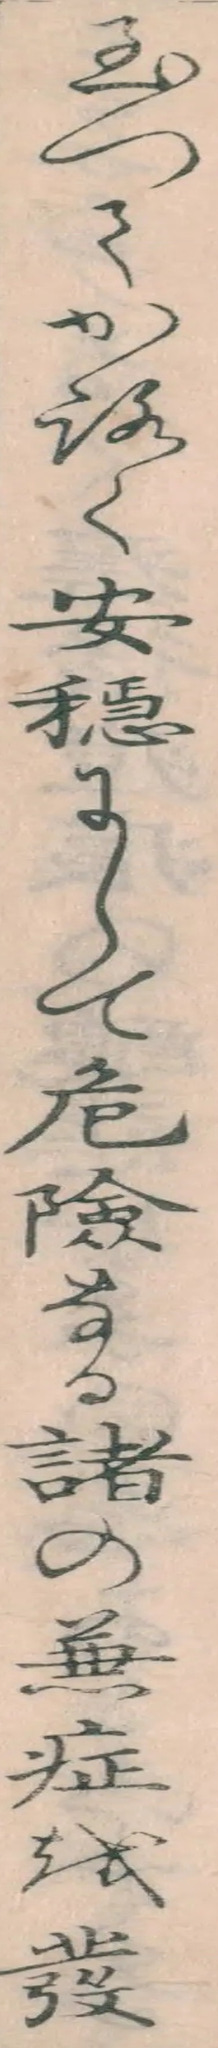至つてかろく安穏にして危険なる諸の無症を發

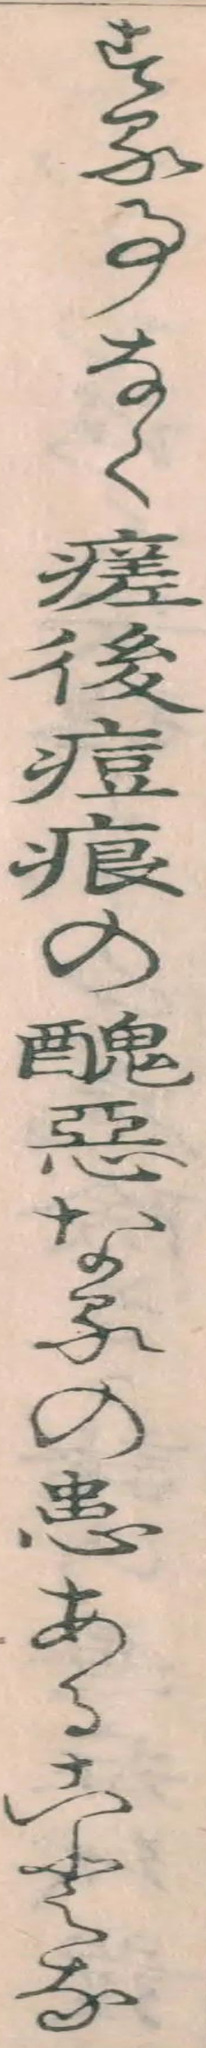する事なく瘥後痘痕の醜惡なるの患あることな
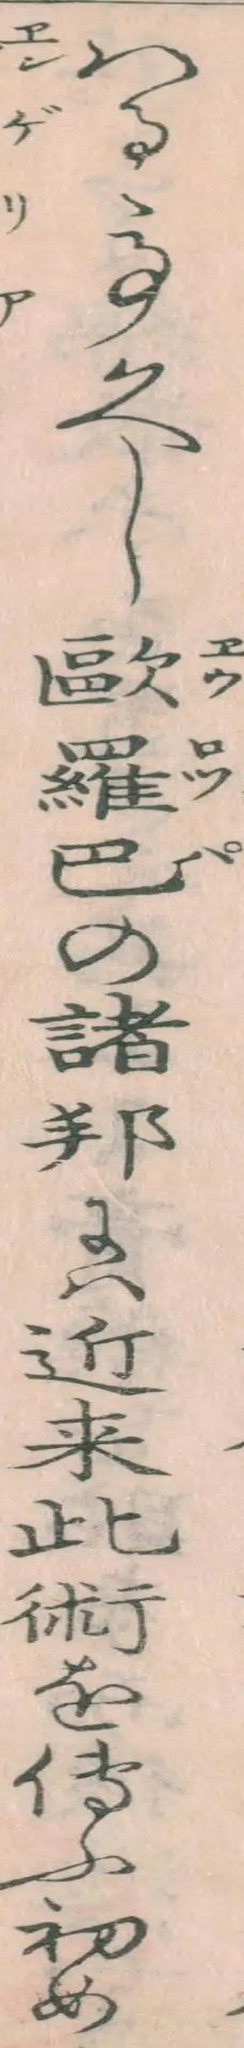はるゝ事久し歐羅巴の諸邦には近来此術を傳ふ初め
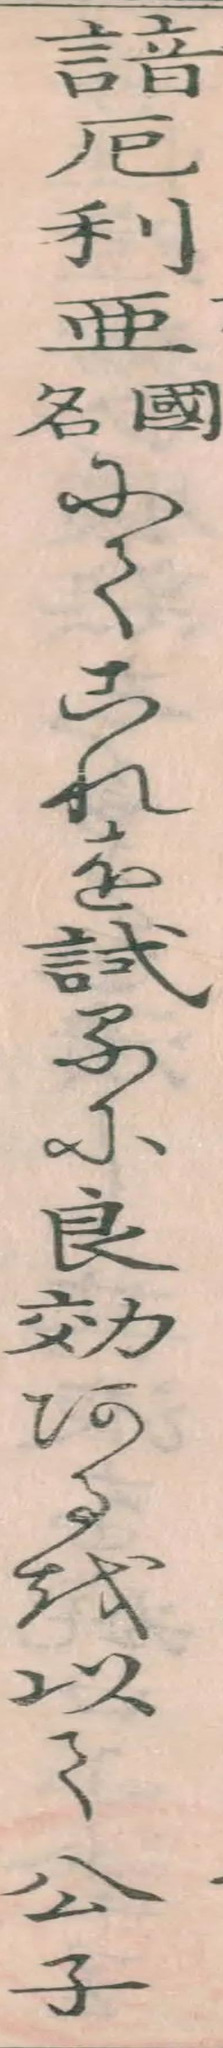諳厄利亜國名にてこれを試るに良効あるを以て公子
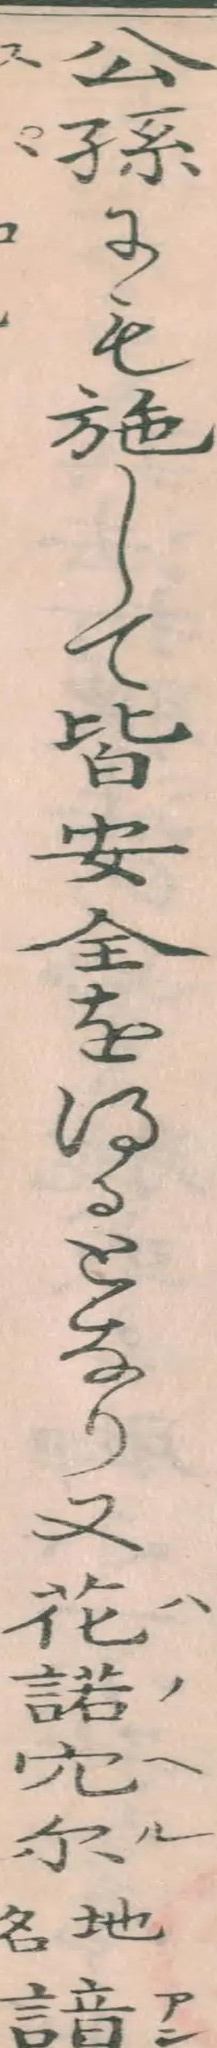公孫にも施して皆安全を得るとなり又花諾穴尓地名諳
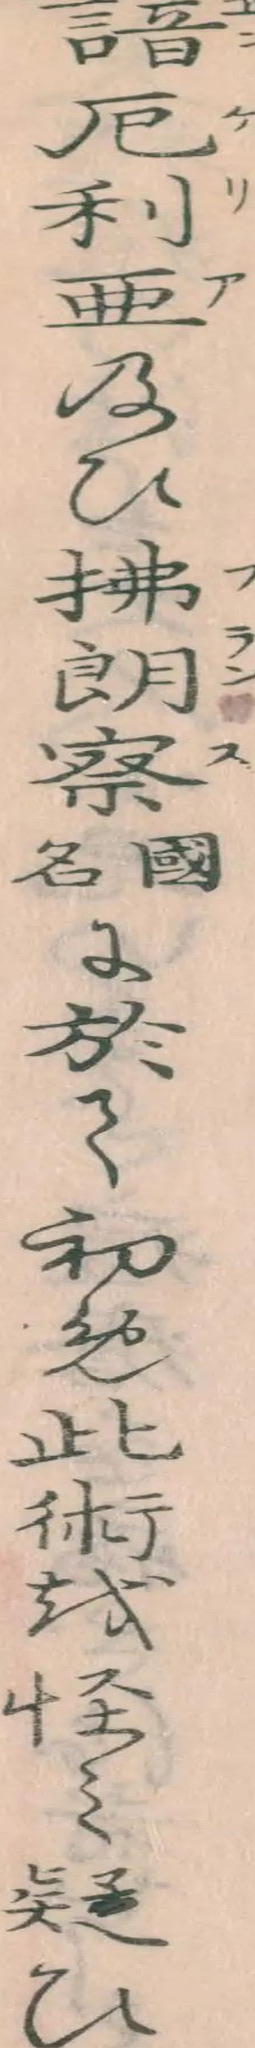諳厄利亜及ひ佛朗察國名に於て初め此術を怪み疑ひ
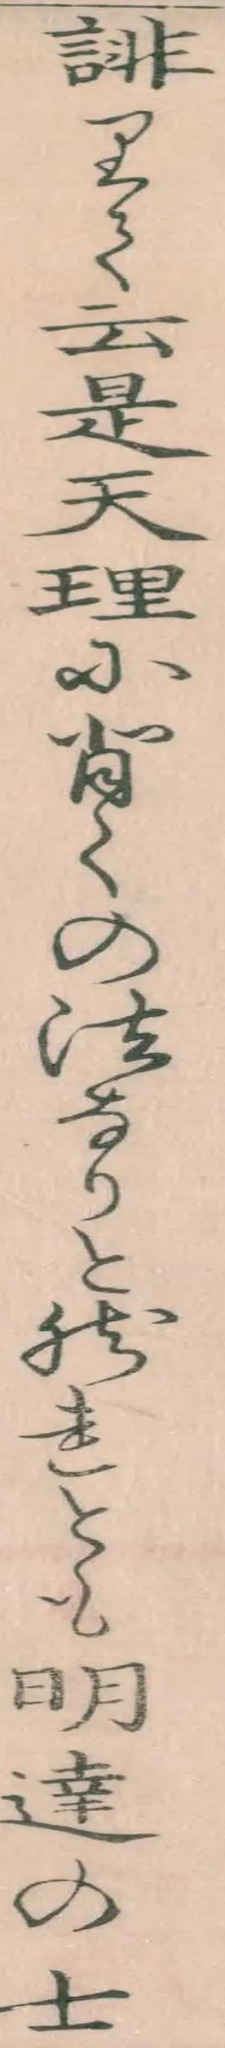誹りて云是天理に背くの法なりと然れとも明達の志
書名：種痘新編
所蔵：国立国会図書館 National Diet Library, JAPAN
